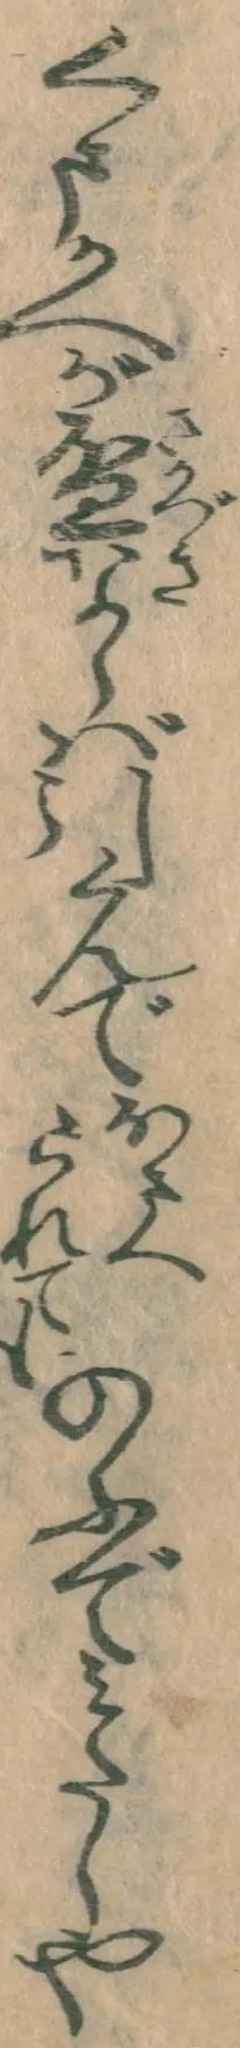くまかへが杯ならば引くんでおさへられてものふでみたしや
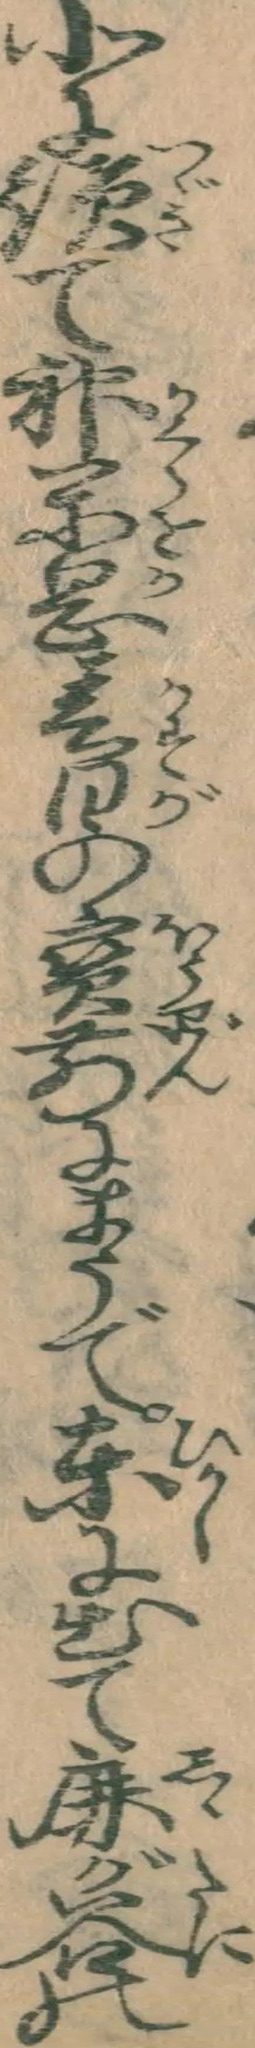北に続て神楽岡春日の宝前にまうで。東に出て鹿が谷の
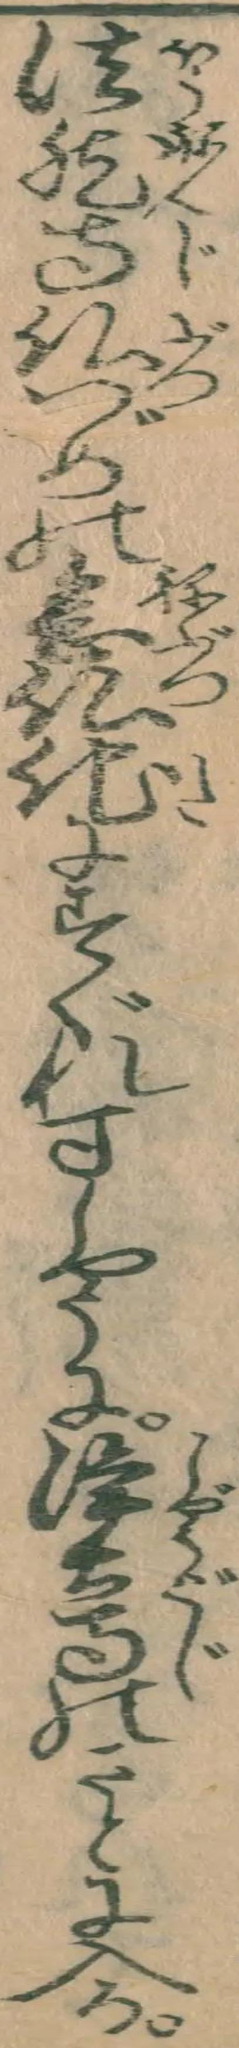法然寺仏づめの念仏他にすぐれすしやうに。浄土寺のさとに入る。
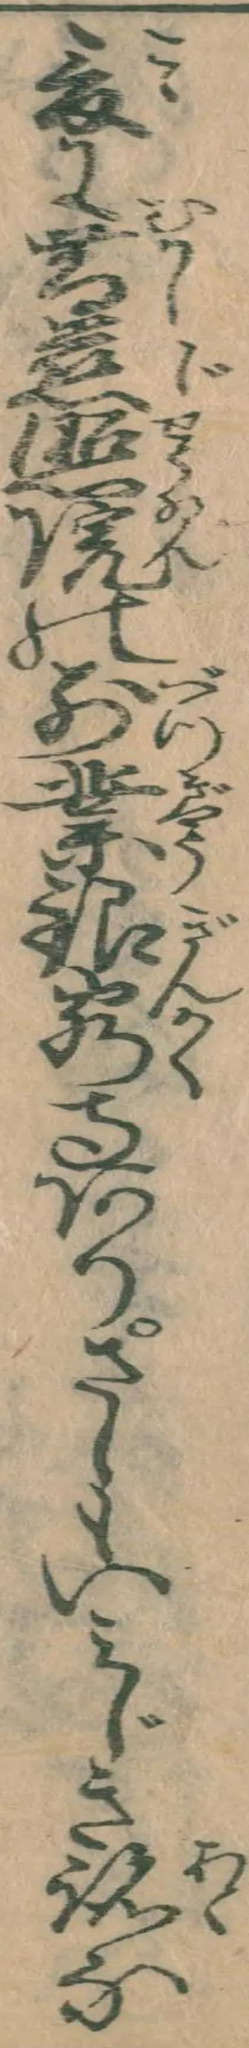爰に昔慈照院の別業銀閣寺あり。さしもいみじき跡な
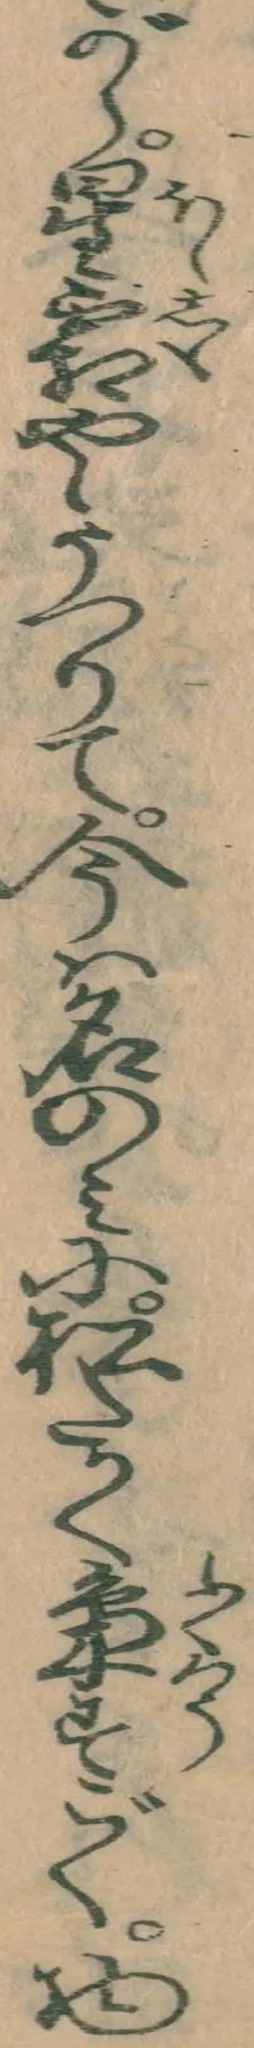がら。星霜やゝうつりて。今は名のみに。松たかく梟すごく。物
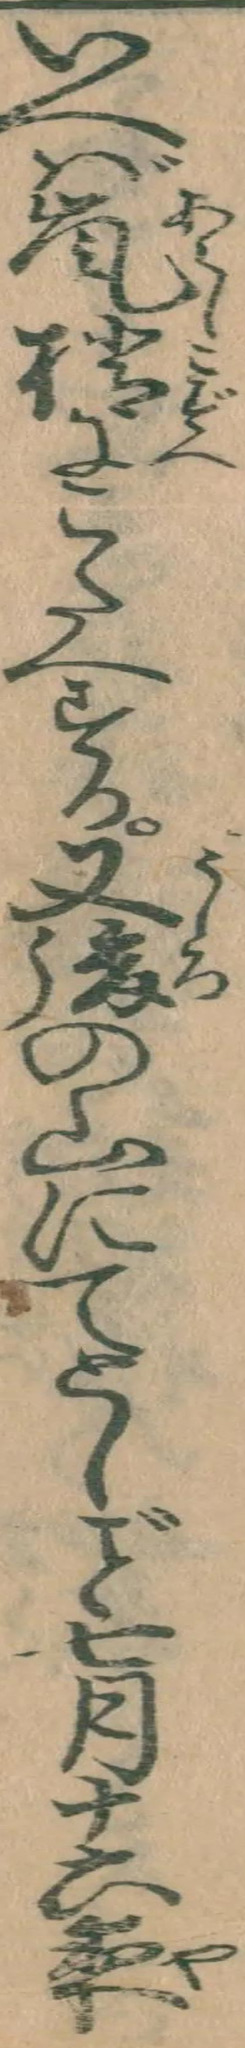いへば嵐梢にこたへする。又後の山にてとしごと七月十六夜
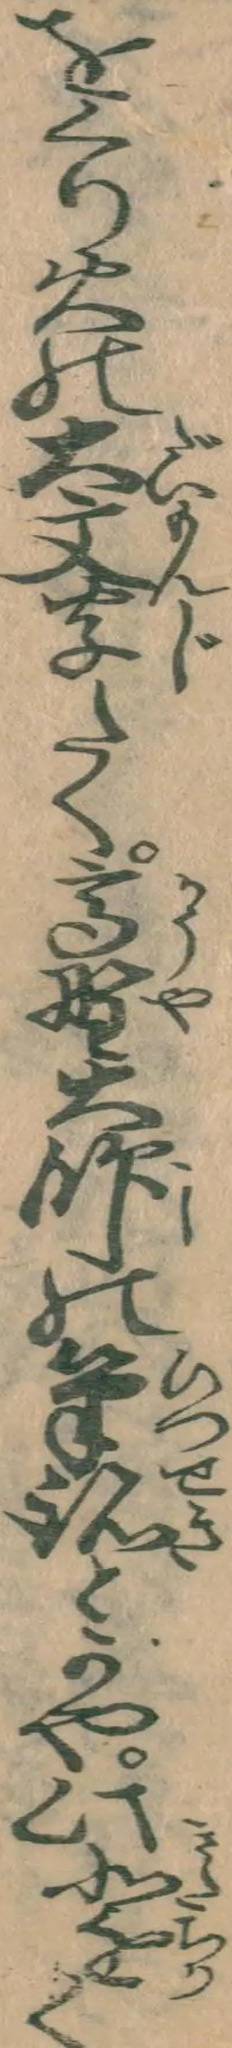をくり火の大文字たく。高野大師の筆跡とかや。此北近く
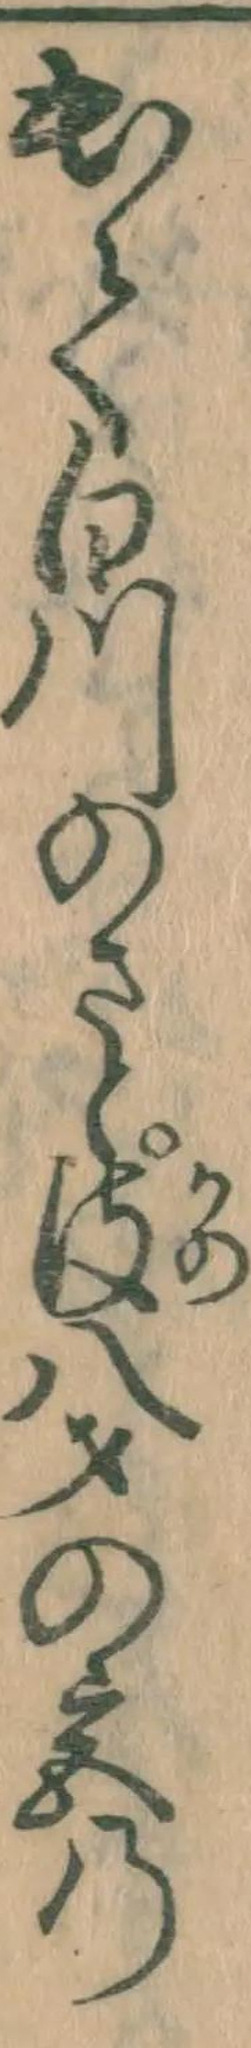出て白川のさと。彼八才の宮の
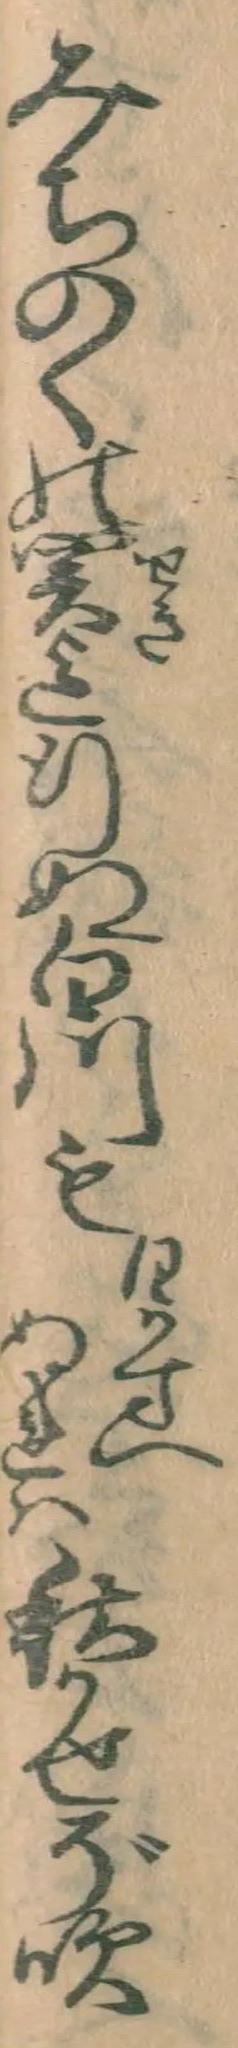みちのくの関迄行ぬ白川も日かすへぬれは秋かせぞ吹
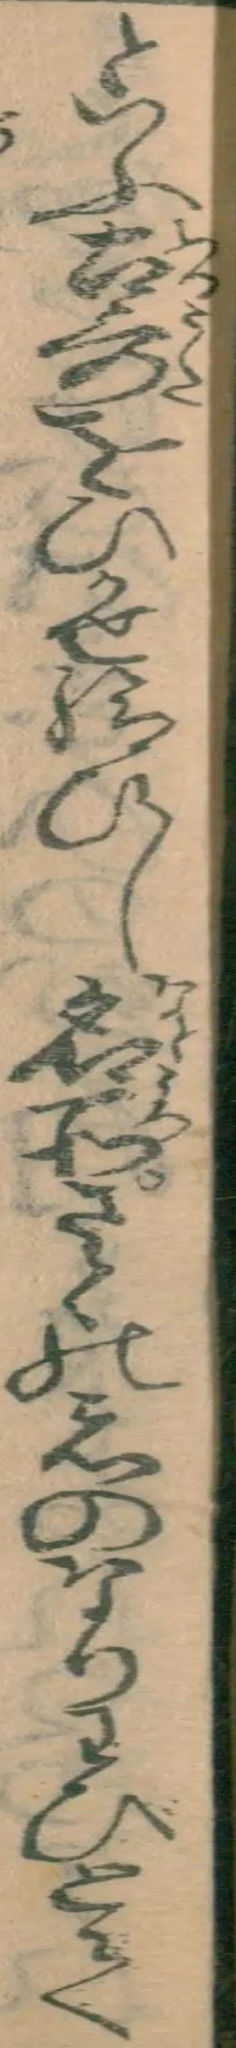といふ古歌をひかせ給ひし名所。さとの者のなりわひとて
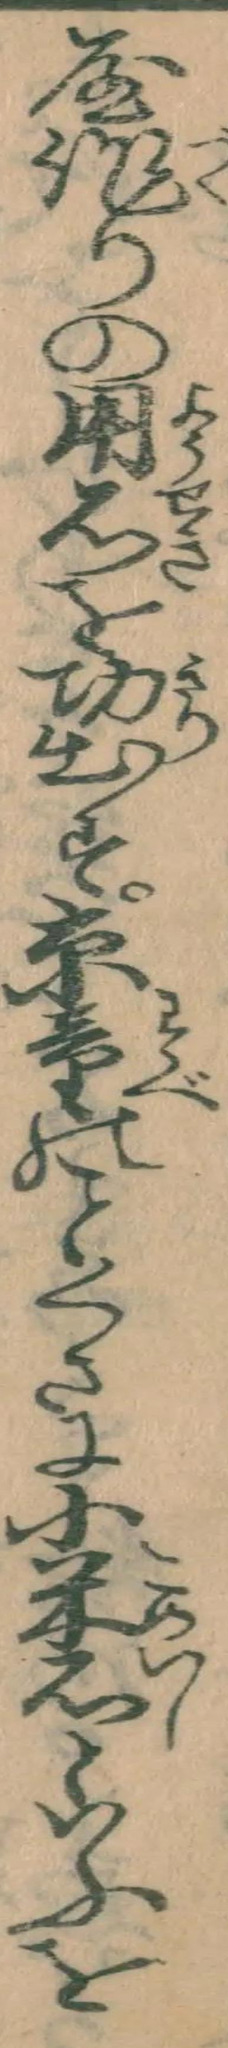屋作りの用石を切出す。京童のことくさに小米石といふを
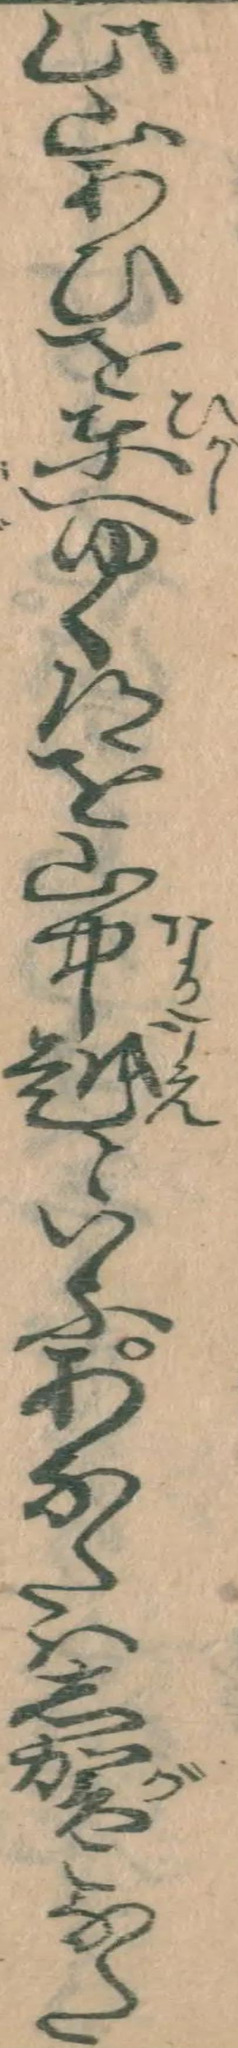此山あひを東へゆく道を山中越といふ。あなたは志賀こなた
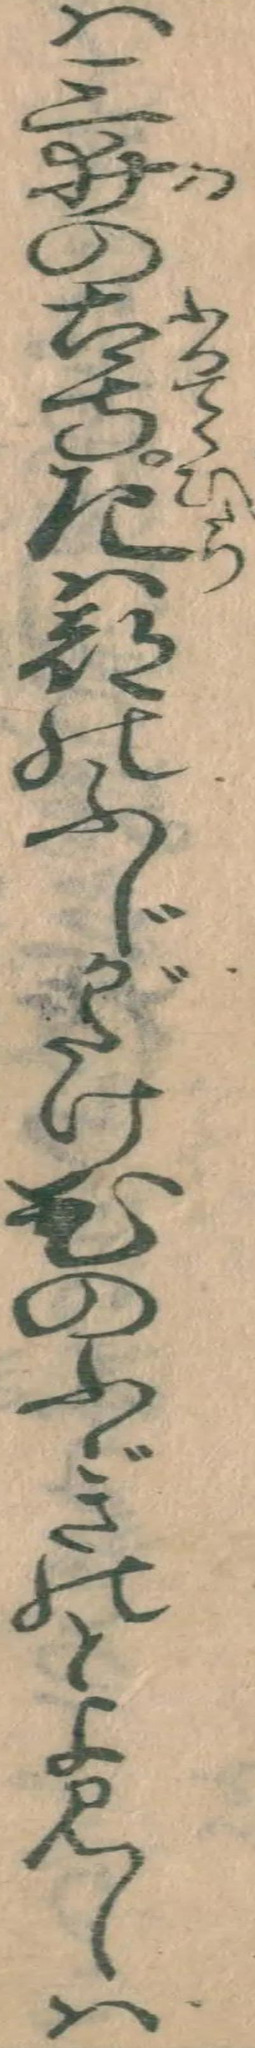は三井の古寺。左は都のふじがたけ花のふゞきのとよみしは
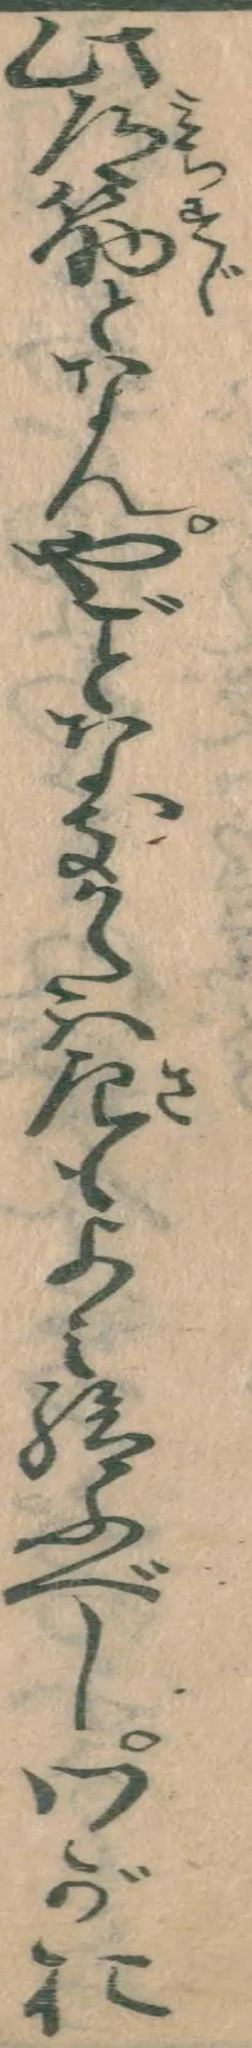此道筋となん。やごとなきかたは左もよみ給ふべし。わがお
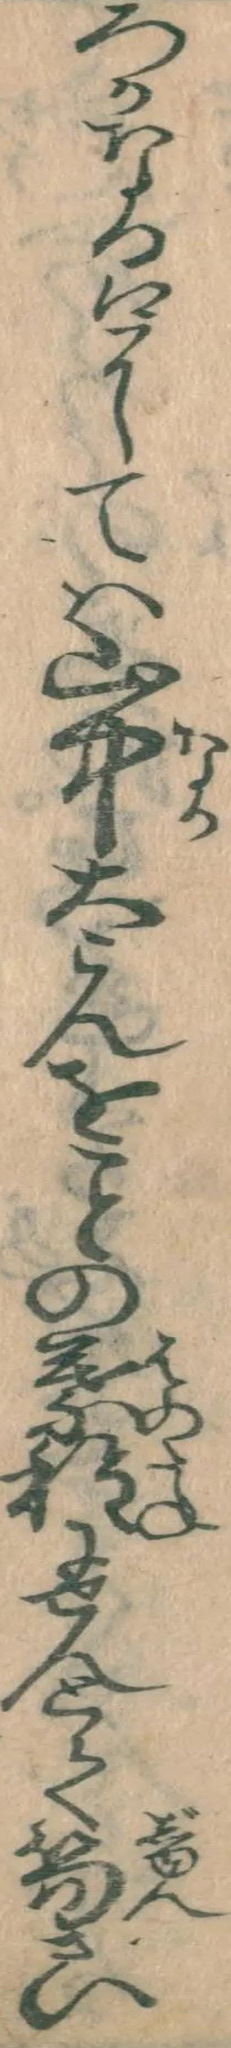ろかなる口にては山中大こんをことの葉種にせんとて筍さい
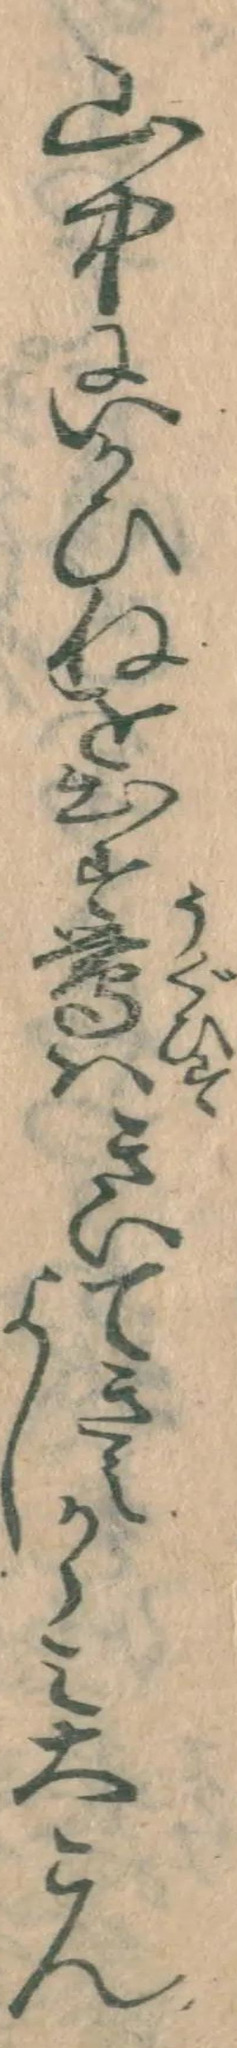山中にいかひねを出す鴬はきいてきみよしからみ大こん
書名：新竹斎 5巻
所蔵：国立国会図書館 National Diet Library, JAPAN
